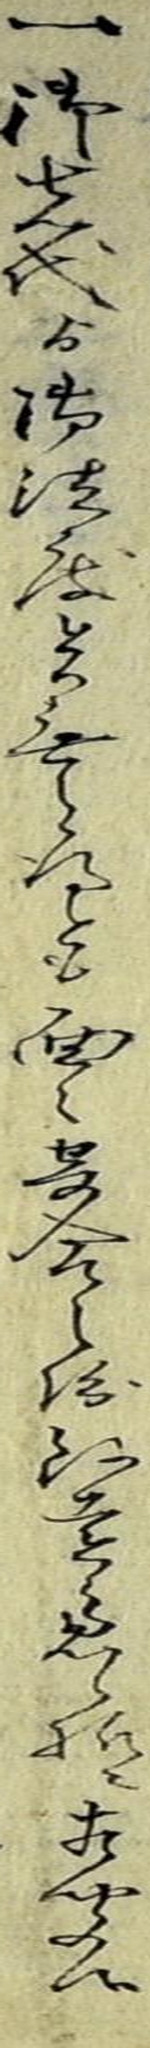一御先代ゟ御法度とハ無之候得とも面々寄合之儀致遠慮候様ニ相聞候
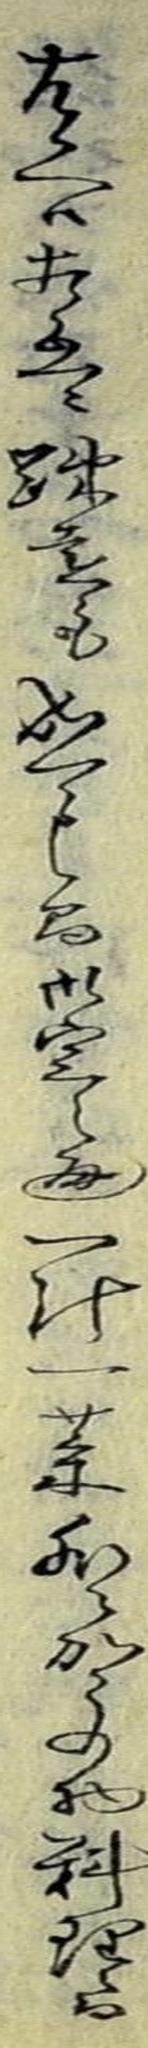たとへハ相互ニ疎遠ニも成可申候間御定之通一汁一菜外ニかうの物料理ニ而
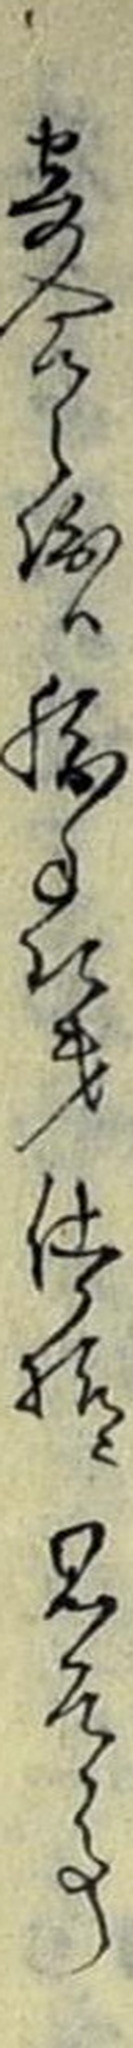寄合之儀ハ勝手次第仕候様ニ思召候事
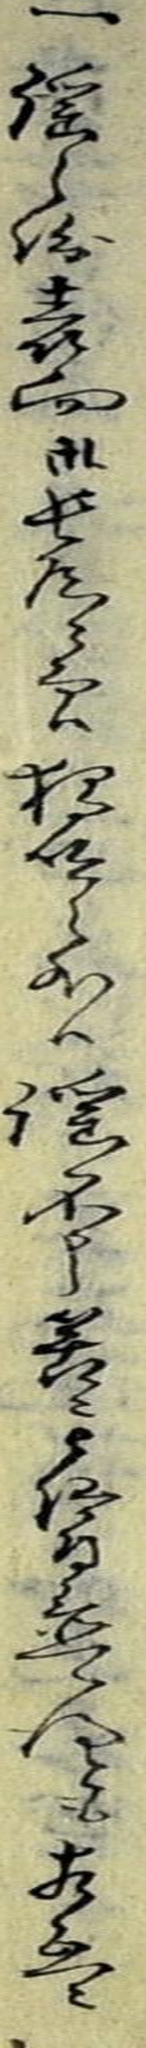一謡之儀表向御長屋ニ而ハ独吟之外ハ謡不申筈ニ被仰付置候得とも相互ニ
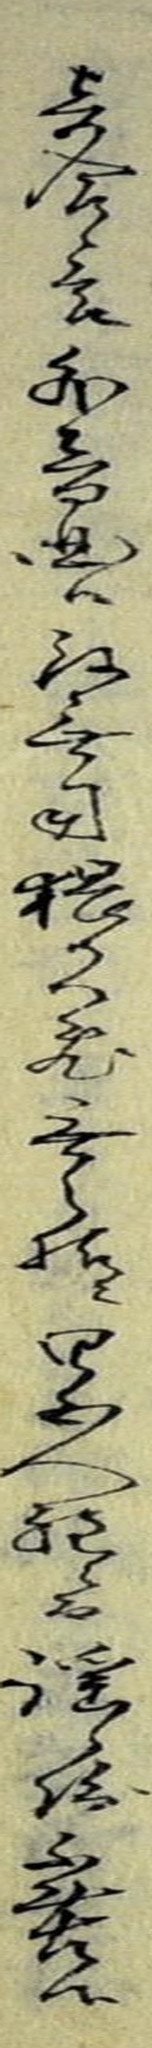寄合候節外音曲ハ致無用猥かハ敷無之様ニ四五人程ニ而謡候儀不苦候
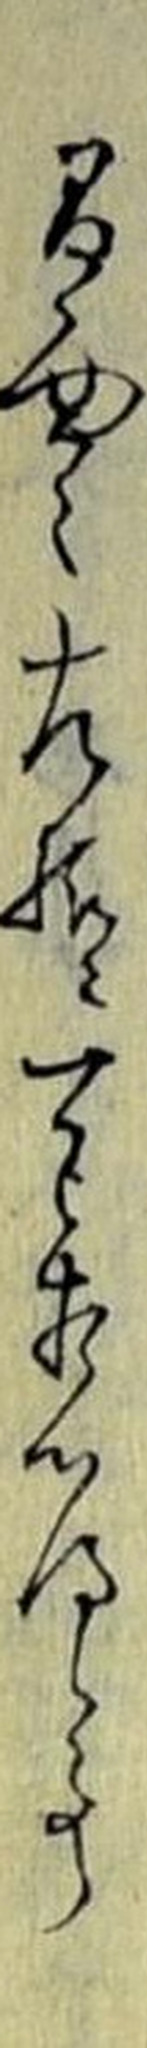間面々左様ニ可被相心得候事
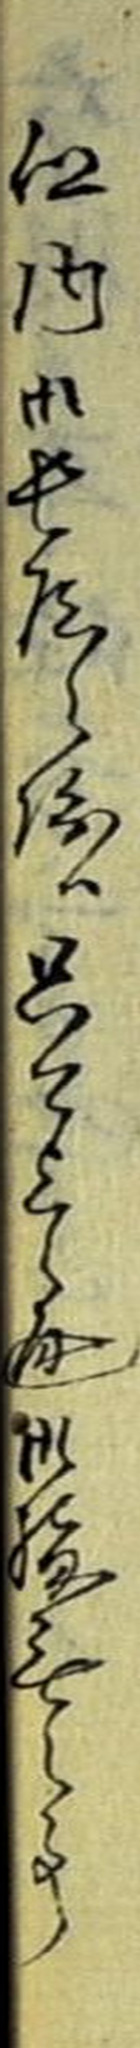但内御長屋之儀ハ只今迄之通御構無之事
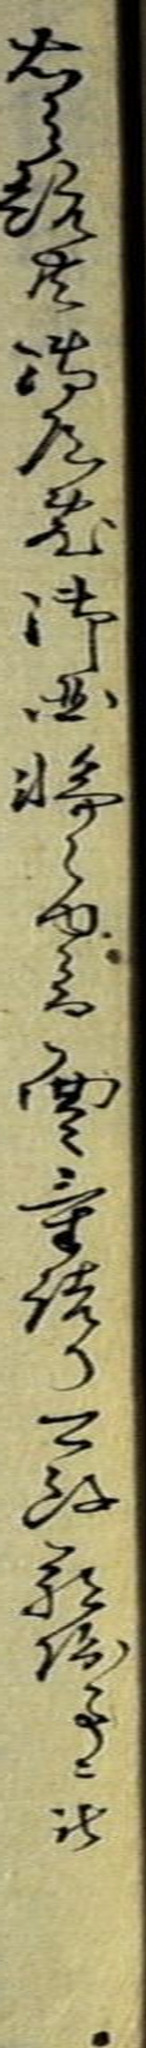右之趣共御屋敷御曲輪之内ニ而面々気詰り可致難儀事ニ被
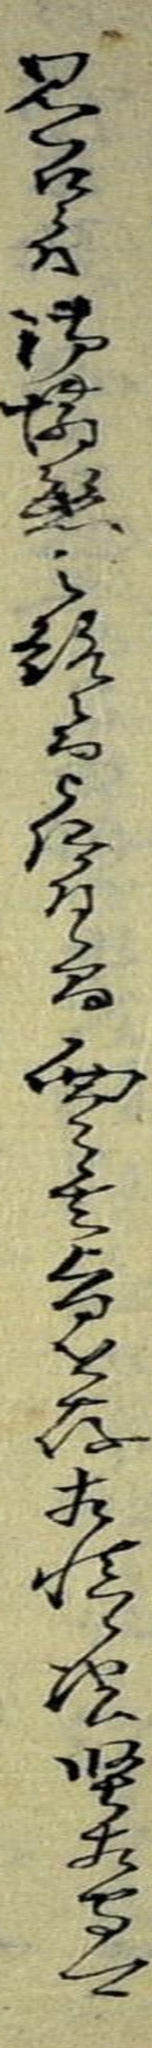思召ニ付御憐愍之趣ニ而被仰付候間面々其旨を存相慎候儀ハ堅相守可
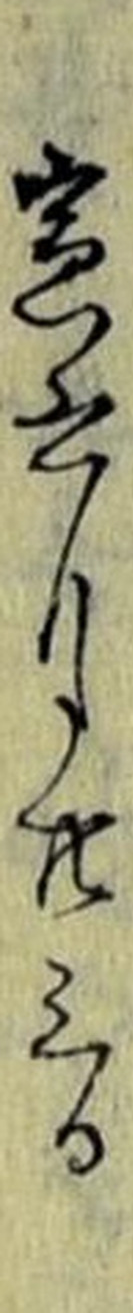寅六月廿三日
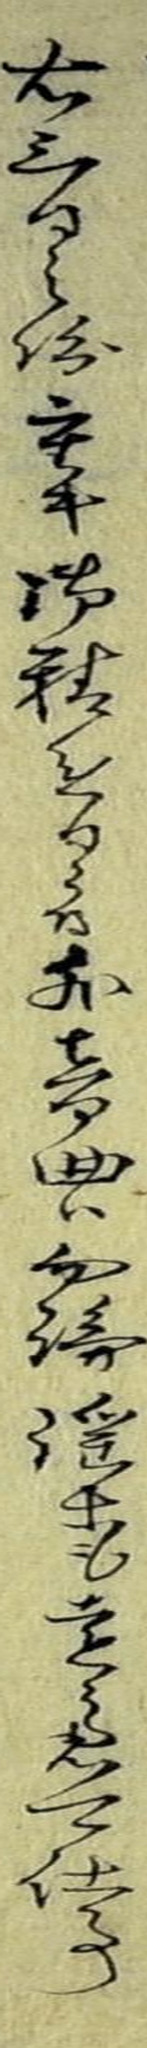右三日之儀重キ御精進日ニ付外音曲ハ勿論謡等も遠慮可仕事
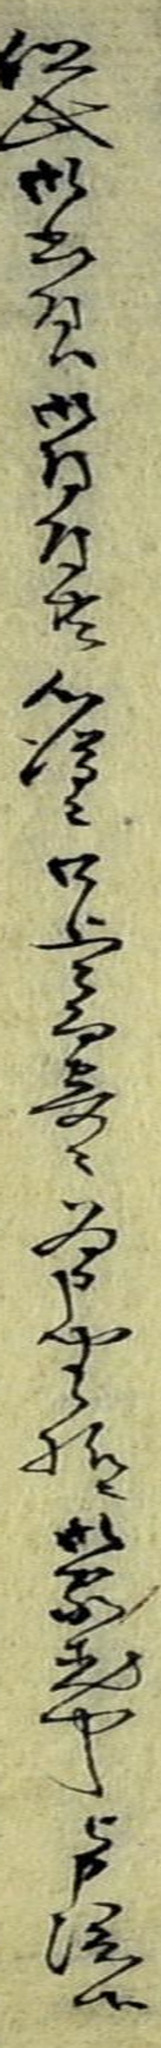但此御書付ハ御目付共心得ニ口上ニ而寄々為申聞候様ニ御家老中被申渡候
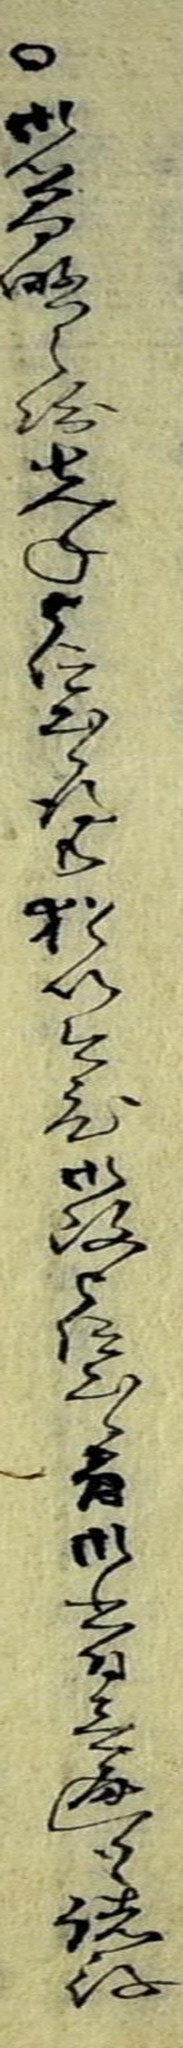〇御簡略之儀先年被仰出候得共猶以今度御改被仰出候旨御書付壱通ツヽ諸役
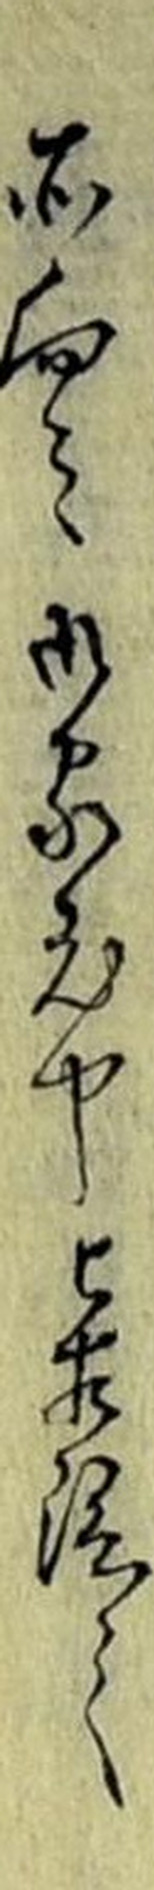所向々へ御家老中被相渡之
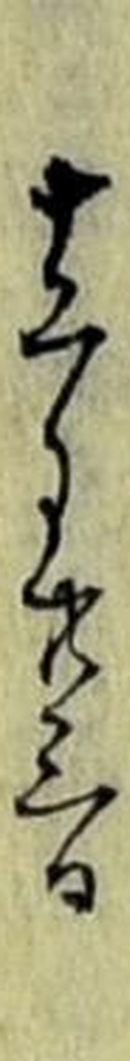十二月廿三日

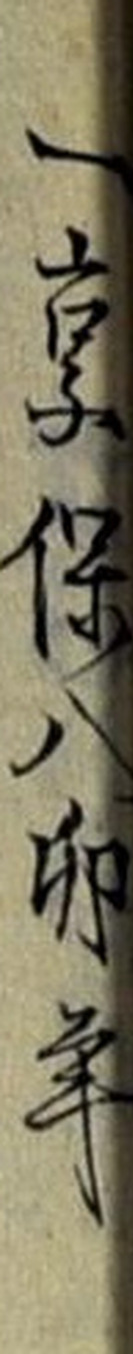一享保八卯年
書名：命令之部 一
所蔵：福井県文書館 Fukui Prefectural Archives
